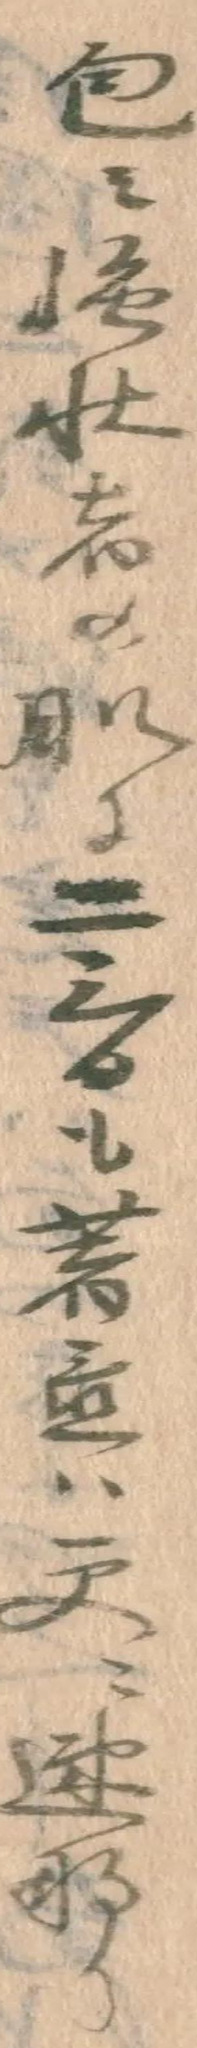包み強壮者の肌に二三日も著置ハ更ニ速なり
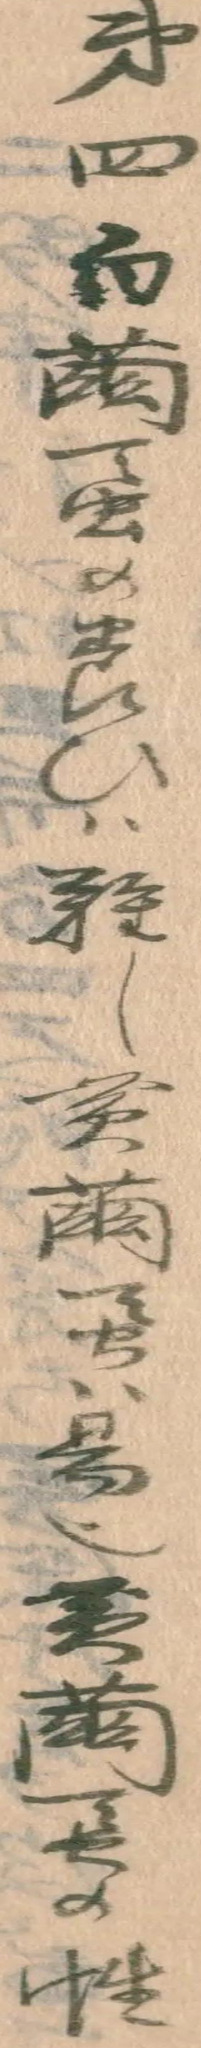第四白繭蚕の養ひハ難し黄繭蚕ハ易也黄繭蚕の性
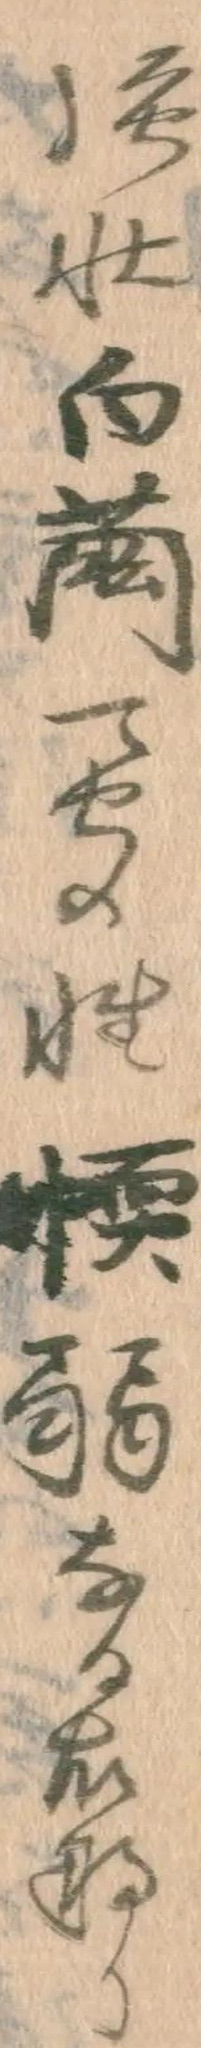強壮白繭蚕の性輭弱なる故なり
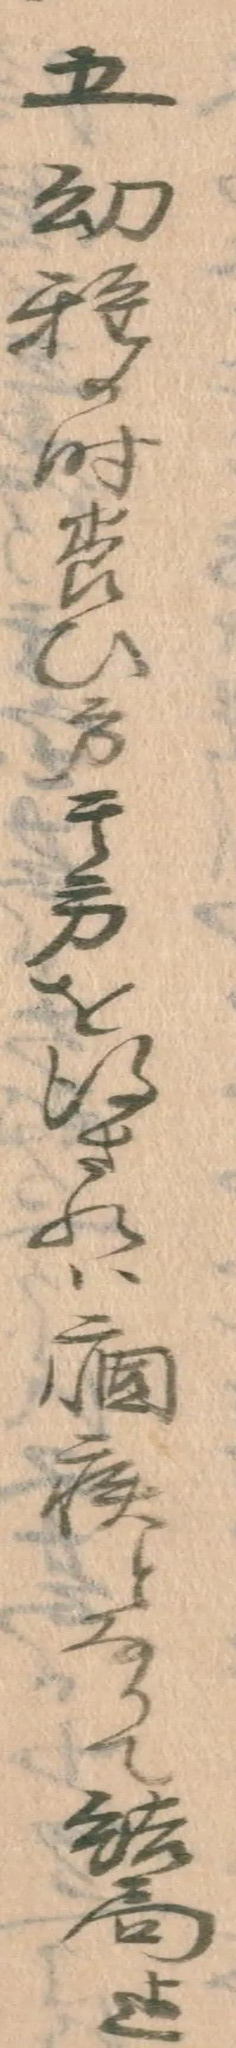第五幼種の時養ひ方其方を得されハ痼疾となりて結局迄
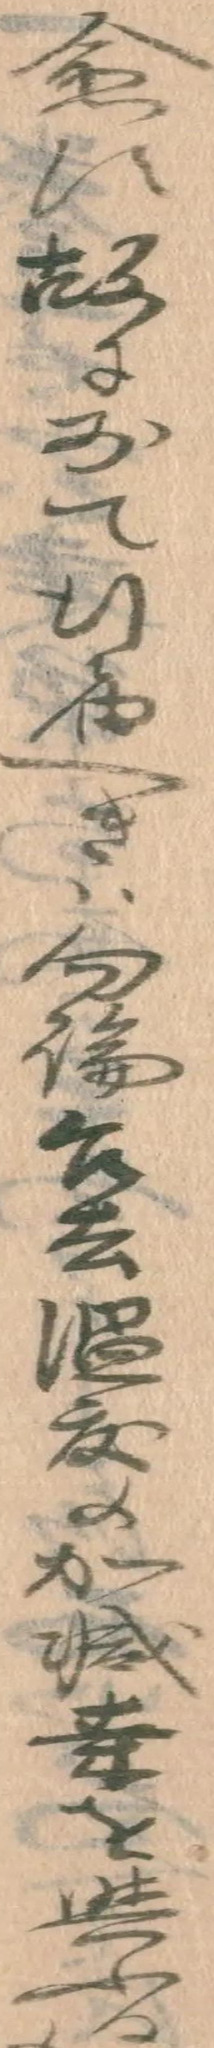愈す故に至て行届へきは勿論乍去温度の加減桑を与ふるの
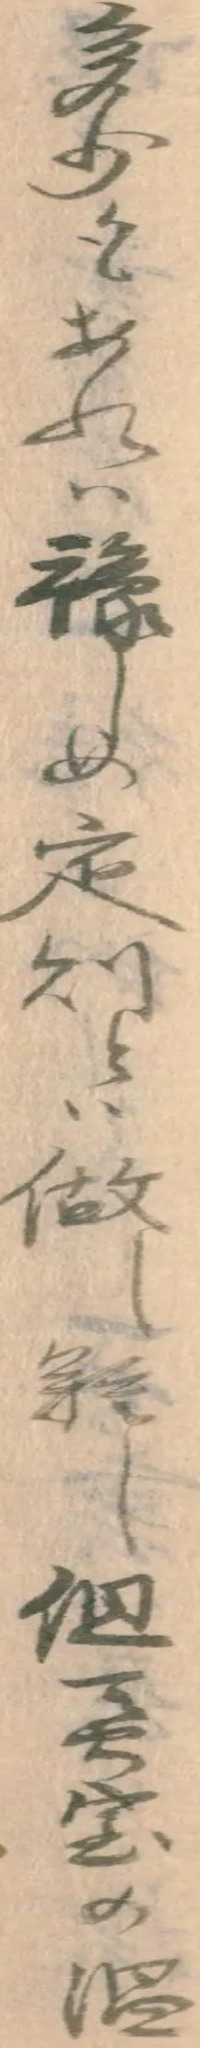多少もあれハ予しめ定則とハ做し難し但蚕室の温
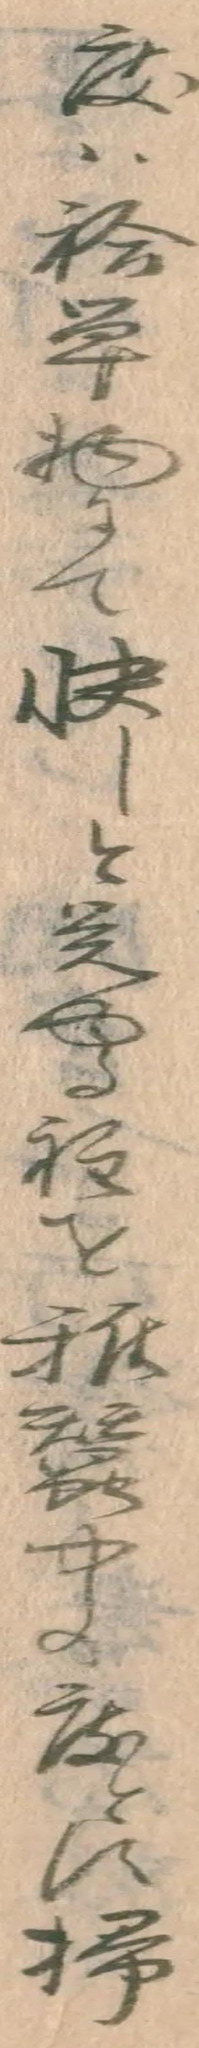度ハ袷単物にて快しと覚ゆる程を稚蚕中の度とす掃
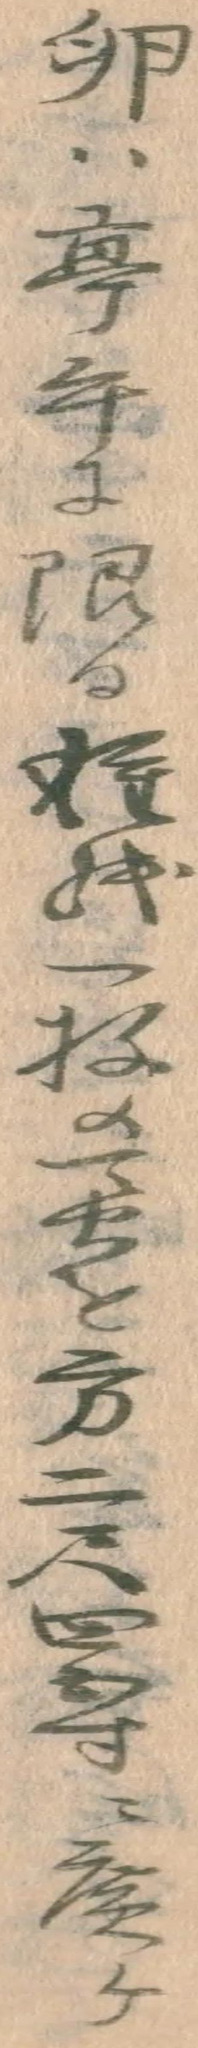卵は亭午に限る種紙一枚の蚕を方二尺四五寸ニ広ケ
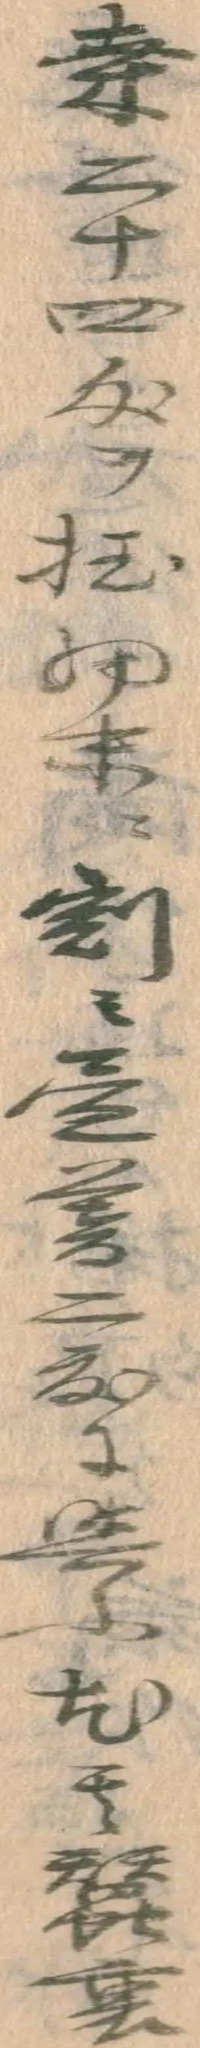桑二十四匁ヲ掴細末ニ割ミ昼暮二度に与ふ尤其蚕裏
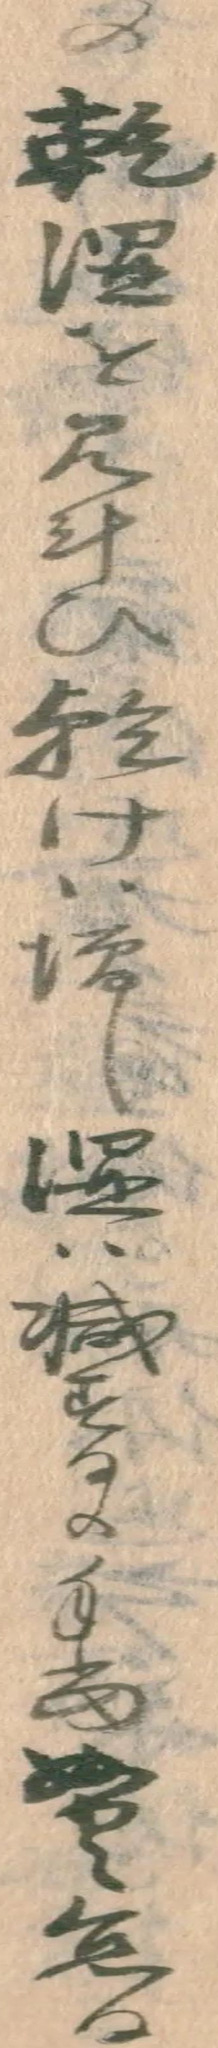の乾湿を見計ひ乾けハ増し温ハ減するの手当努々怠る
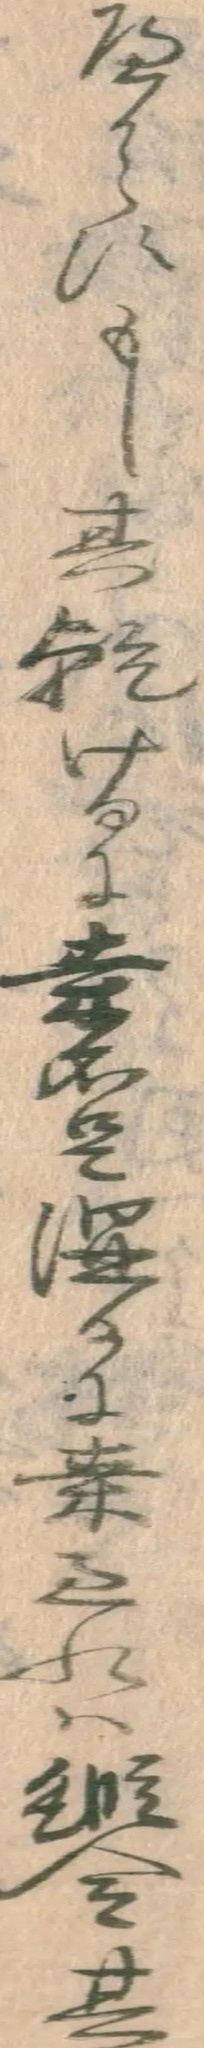へからすもし其乾けるに桑不足湿るに桑過れハ縦令其
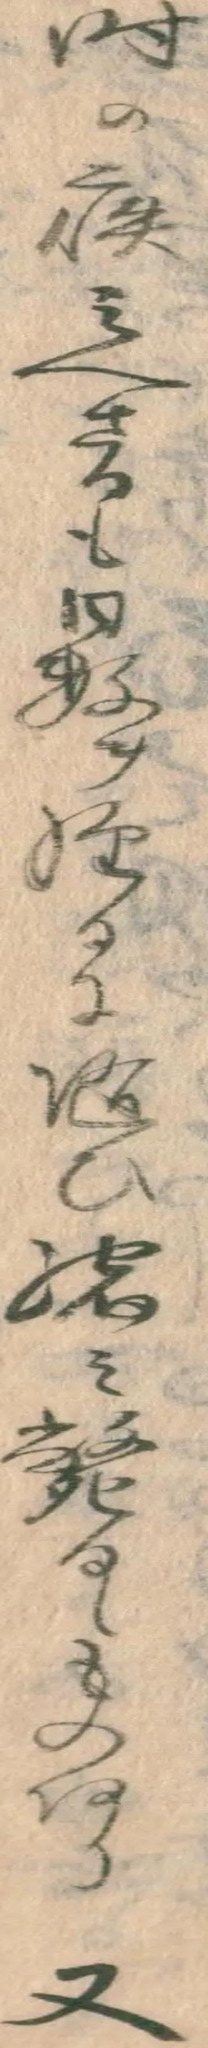時の疾みへさるも日数ヲ経るに随ひ縮み斃るゝものあり又
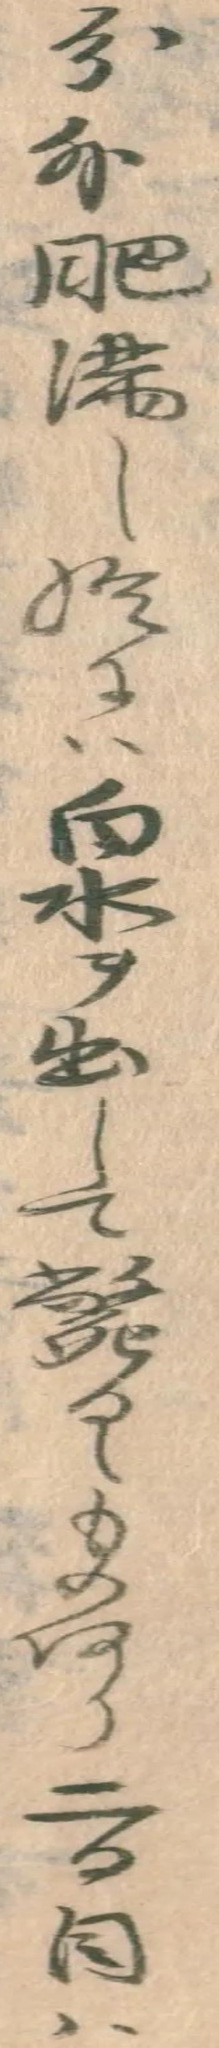分外肥満し終にハ白水ヲ出して斃るゝものあり二日目ハ
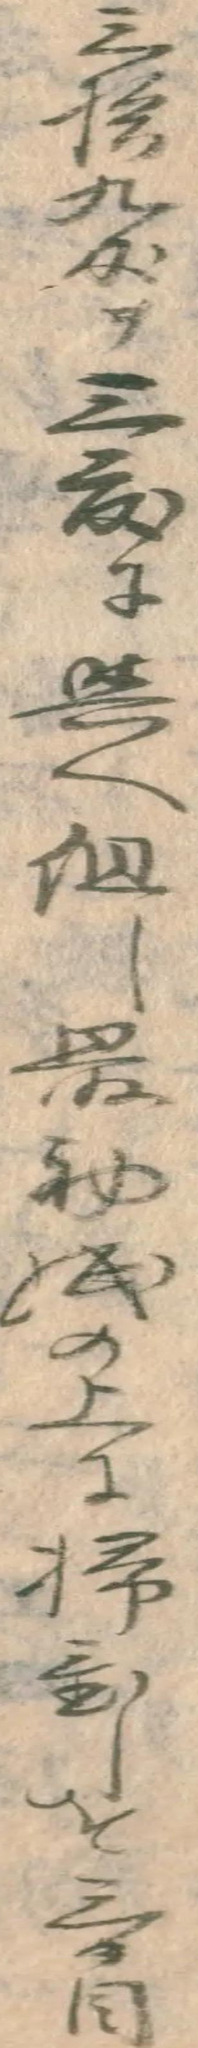三拾九匁を三度に与へ但し最初紙の上に掃置しを三日目
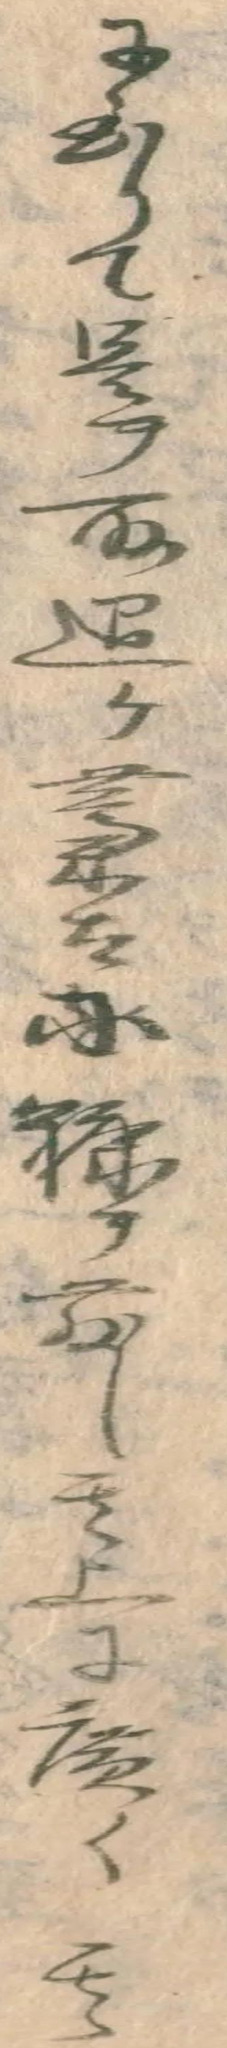に至りて是ヲ取退ケ藁太に糠ヲ散し其上に広く其
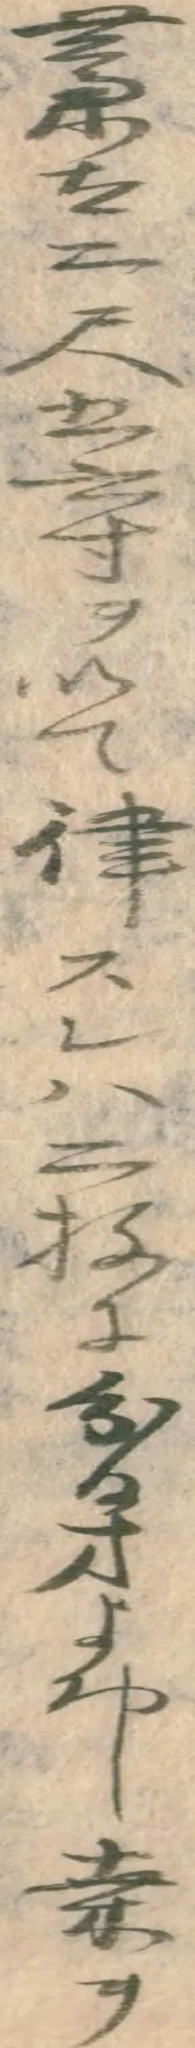藁太二尺五六寸ヲ以て律スレハ二枚に分る方よろし桑ヲ
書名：蚕桑集成
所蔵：国立国会図書館 National Diet Library, JAPAN
